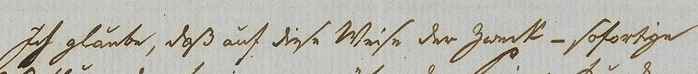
Ich glaube, daß auf diese Weise der Zweck – sofortige
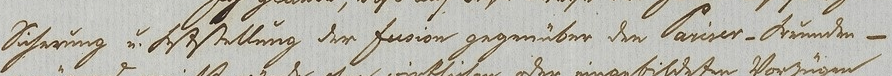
Sicherung u. Feststellung der Fusion gegenüber den Pariser-Freunden –
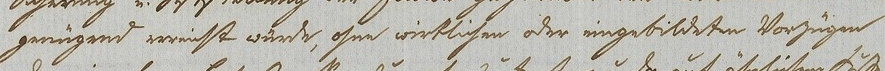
genügend erreicht würde, ohne wirklichen oder eingebildeten Vorzügen
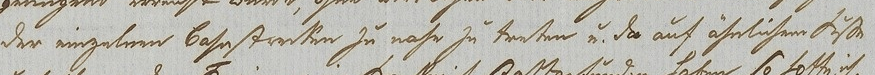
der einzelnen Bahnstrecken zu nahe zu treten u. da auf ähnlichem Fuße
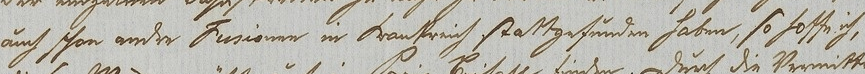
auch schon andre Fusionen in Frankreich stattgefunden haben, so hoffe ich,
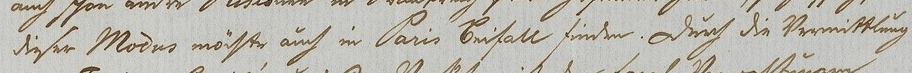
dieser Modus möchte auch in Paris Beifall finden. Durch die Vermittlung
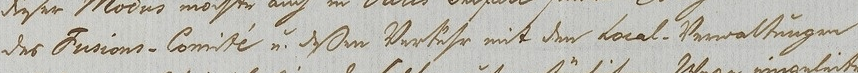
des Fusions-Comité u. deßen Verkehr mit den Local-Verwaltungen
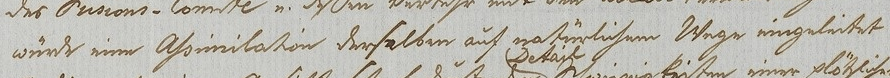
würde eine Assimilation derselben auf natürlichem Wege eingeleitet
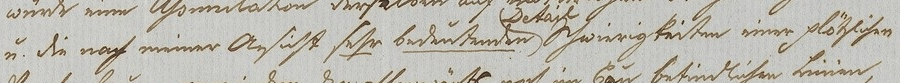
u. die nach meiner Ansicht sehr bedeutendenDetail Schwierigkeiten einer plötzlichen
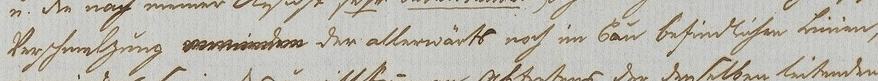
Verschmelzung vermieden der allerwärts noch im Bau befindlichen Linien,
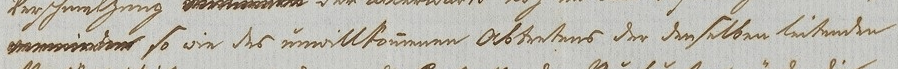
vermieden so wie des unwillkommenen Abtretens der denselben leitenden
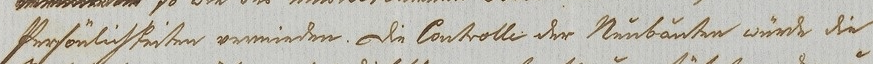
Persönlichkeiten vermieden. Die Controlle der Neubauten würde die
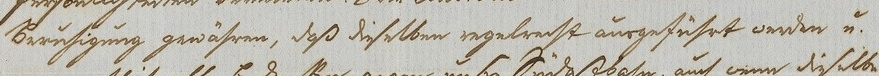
Beruhigung gewähren, daß dieselben regelrecht ausgeführt werden u.
